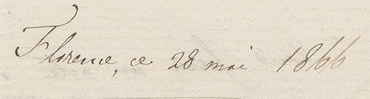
Florence, ce 28 mai 1866
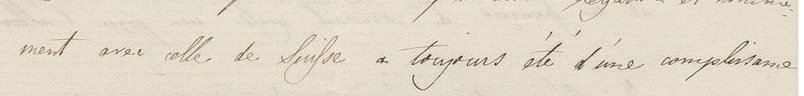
ment avec celle de Suisse a toujours été d'une complaisence
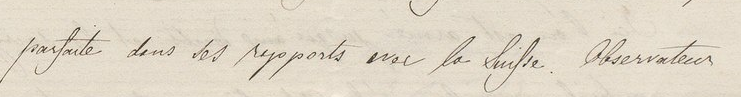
parfaite dans ses rapports avec la Suisse. Observateur
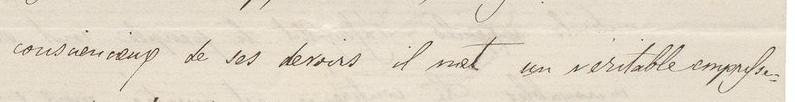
consciencieux de ses devoirs il met un véritable empresse-
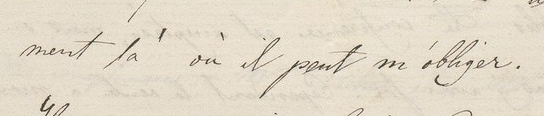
ment là où il peut m'obliger.
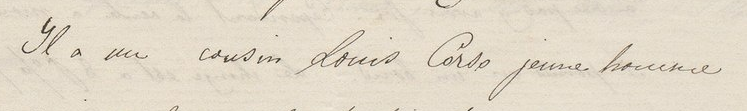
Il a un cousin Louis Corso jeune homme
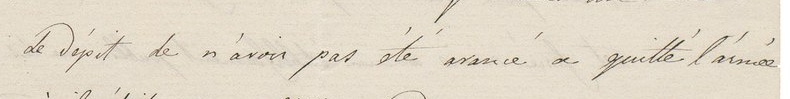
de dépit de n'avoir pas été avancé a quitté l'armée
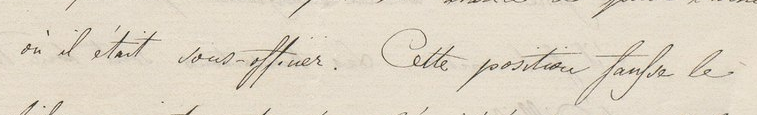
où il était sous-officier. Cette position fausse le
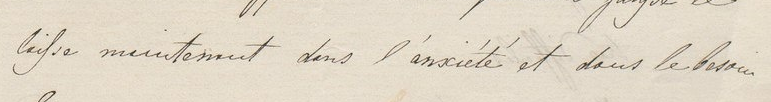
laisse maintenant dans l'anxiété et dans le besoin.
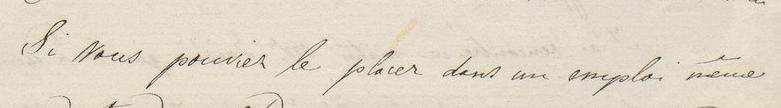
Si vous pouviez le placer dans un emploi même
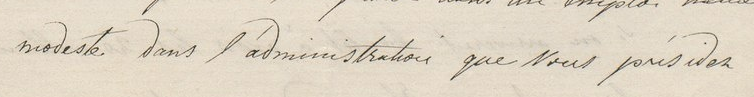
modeste dans l'administration que Vous présidez
